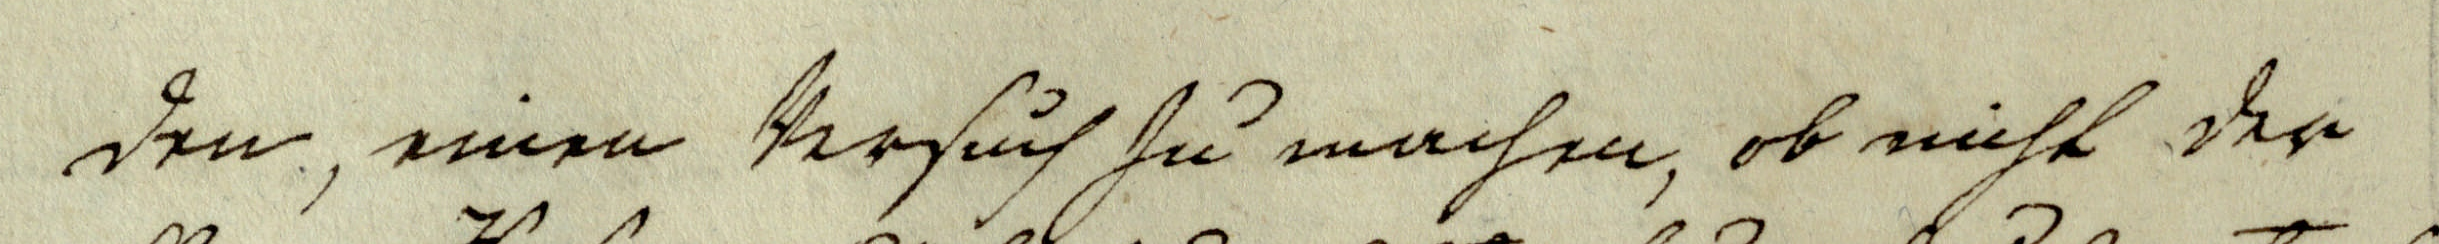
den, einen Versuch zu machen, ob nicht der
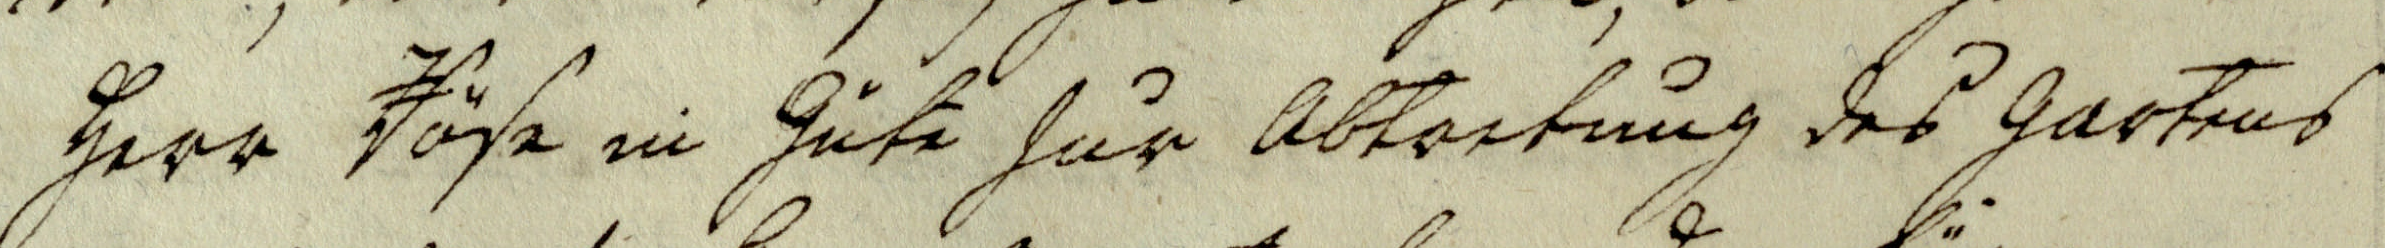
Herr Röse in Güte zur Abtretung des Gartens
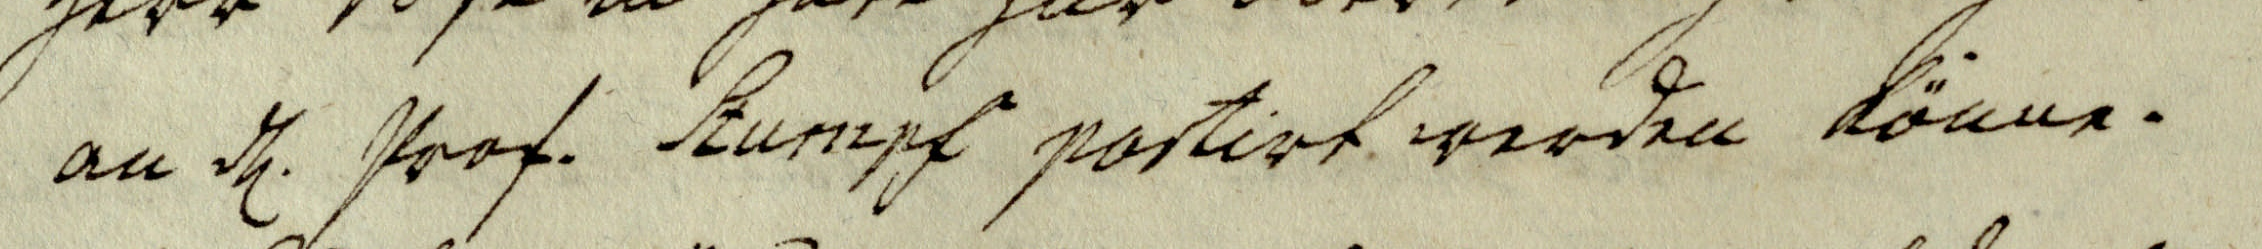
an dh. Prof. Stumpf portirt werden könne.
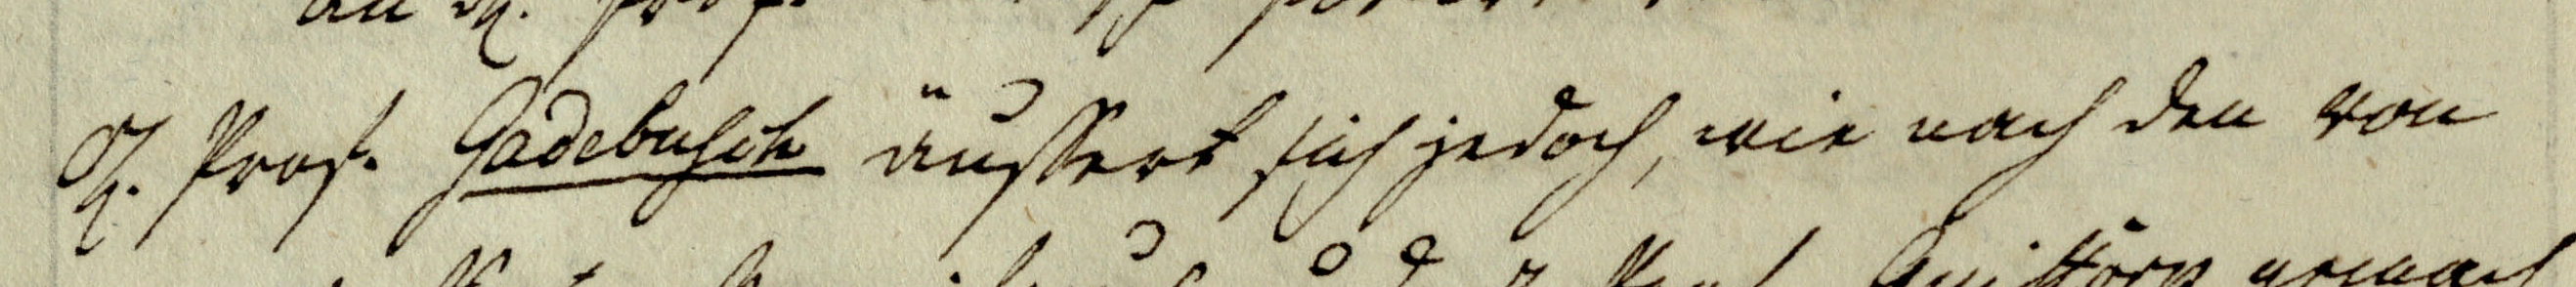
dh. Prof. Gadebusch äussert sich jedoch, wie nach den von
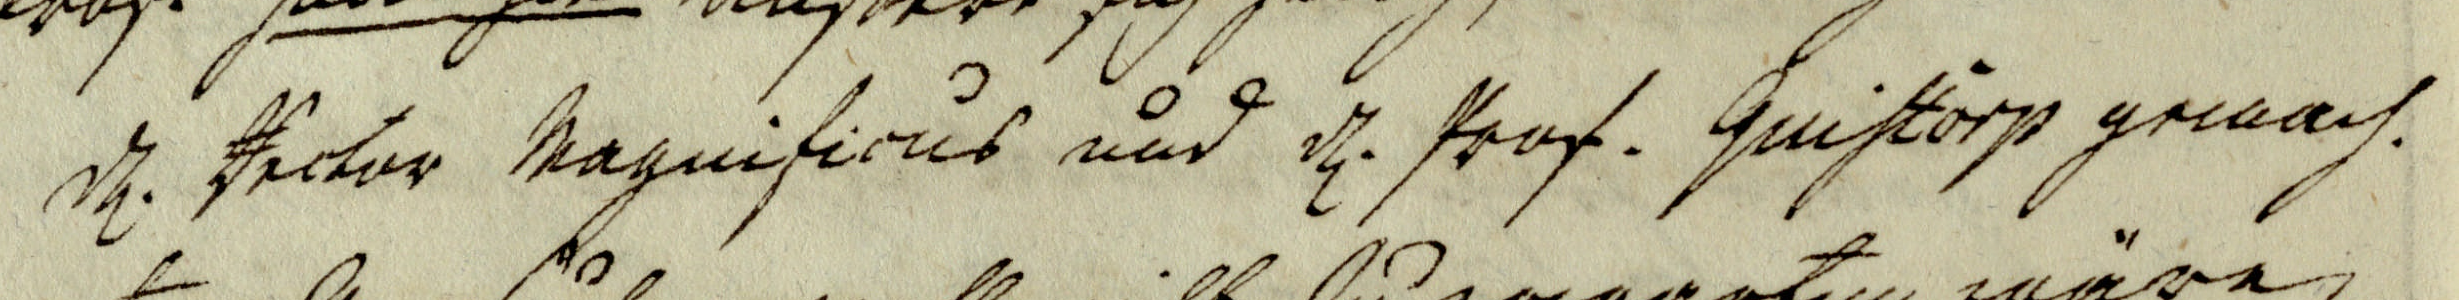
dh. Rector Maginificus und dh. Prof. Quistorp gemach¬
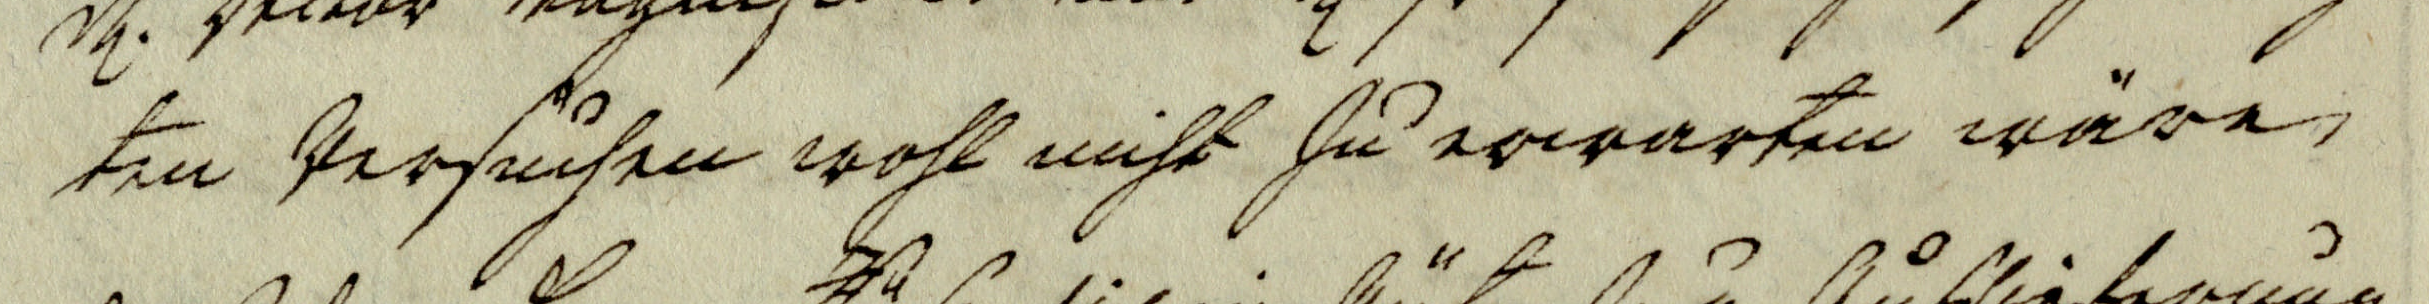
ten Versuchen wohl nicht zu erwarten wäre,
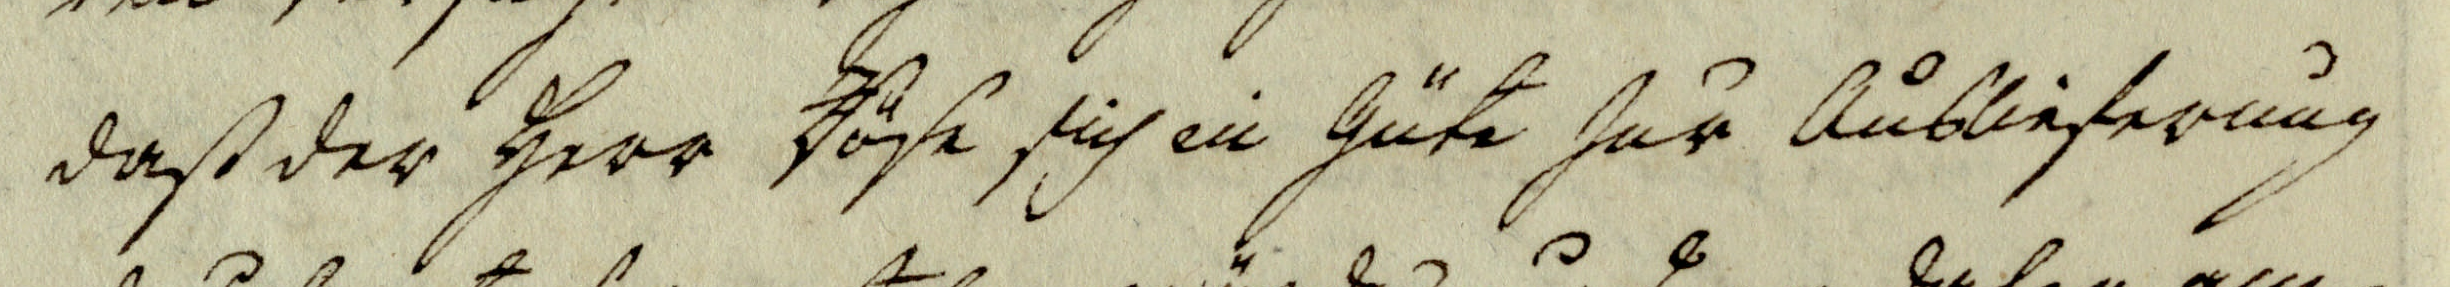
daß der Herr Röse sich in Güte zur Auslieferung
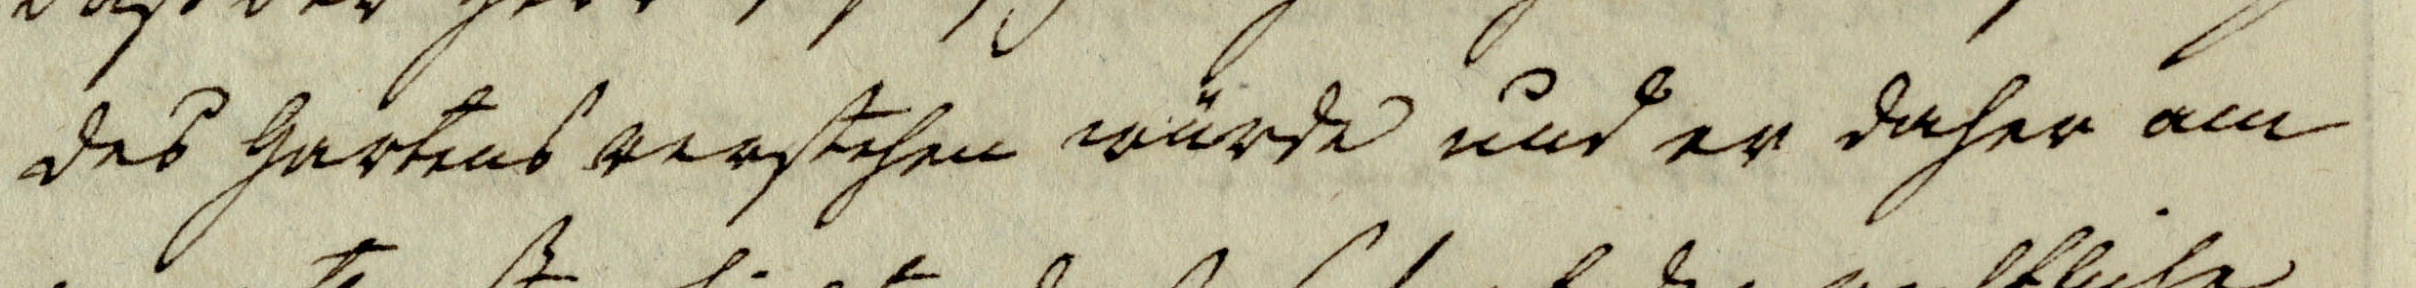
des Gartens verstehen würde und er daher am
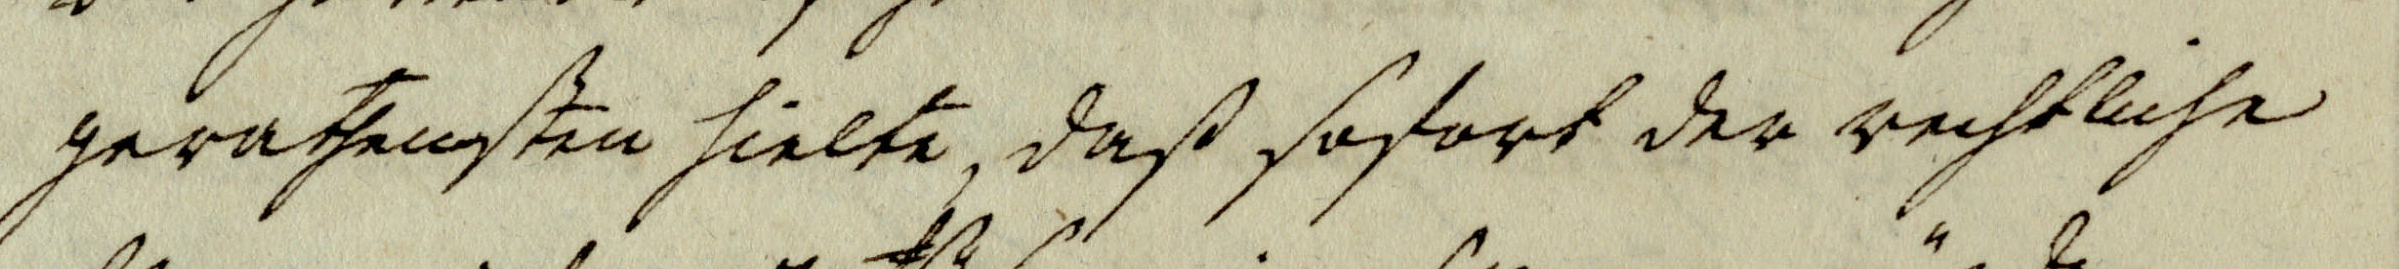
gerathensten hielte, daß sofort der rechtliche
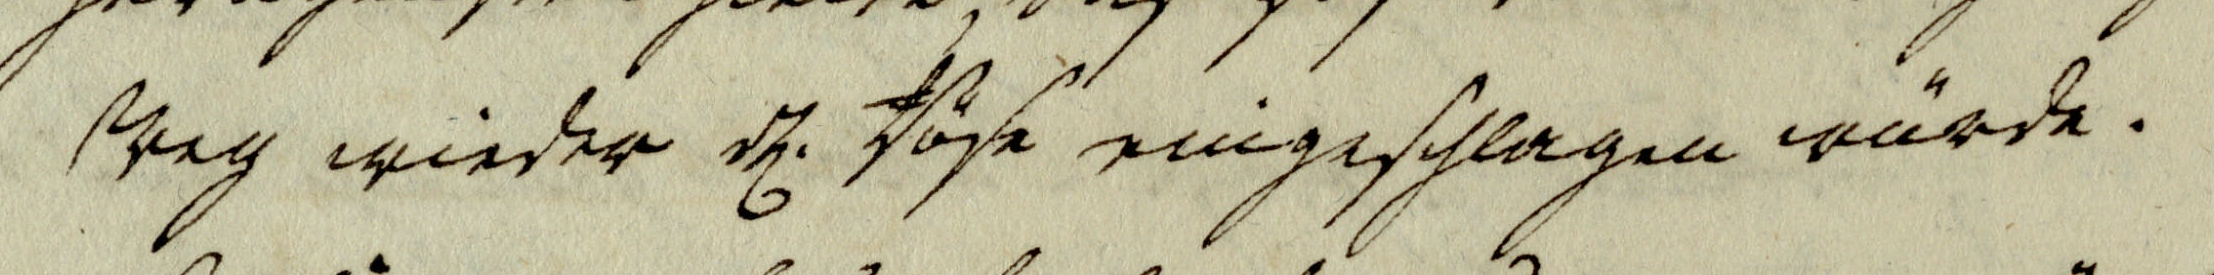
Weg wieder dh. Röse eingeschlagen würde.
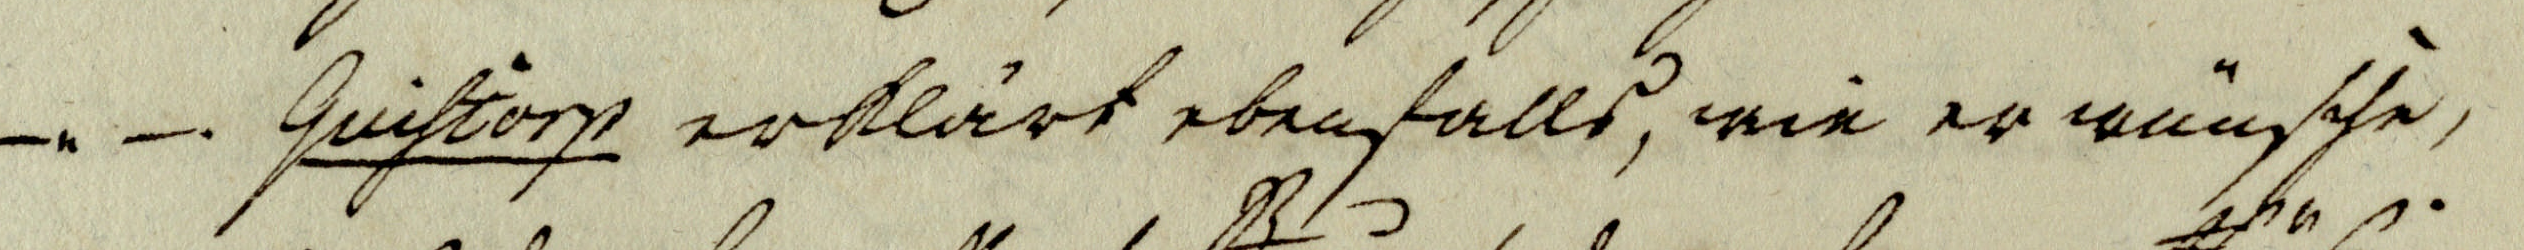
Quistorp erklärt ebenfalls, wie er wünsche,
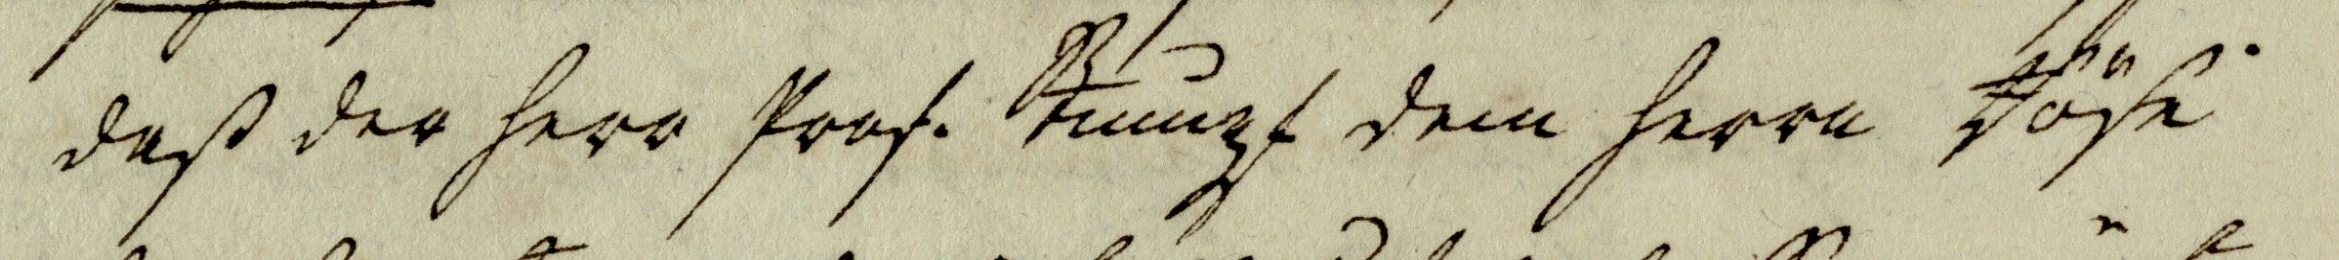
daß der Herr Prof. Stumpf dem Herrn Röse
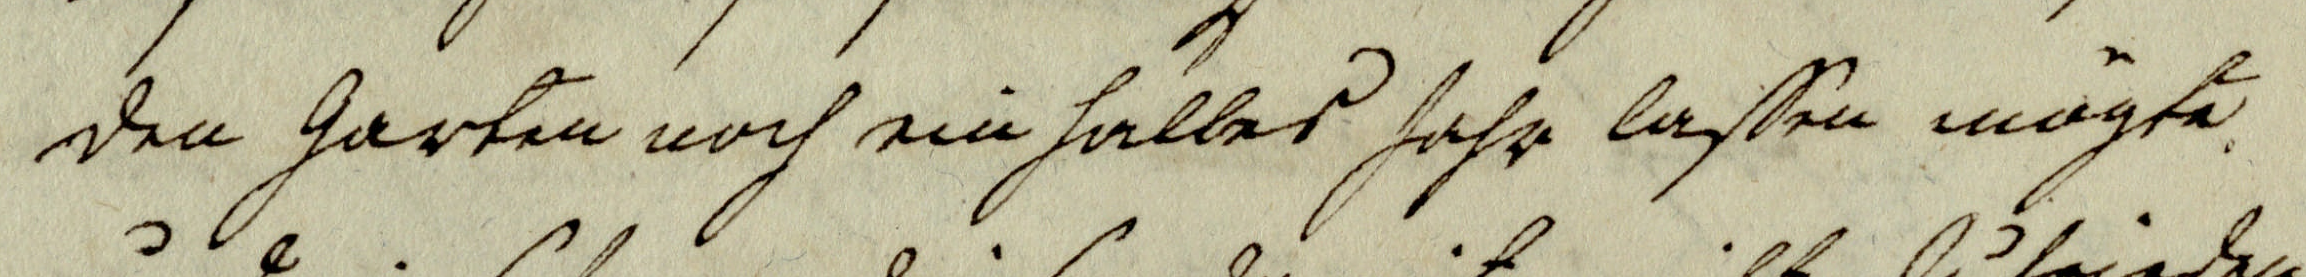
den Garten noch ein halbes Jahr lassen mögte
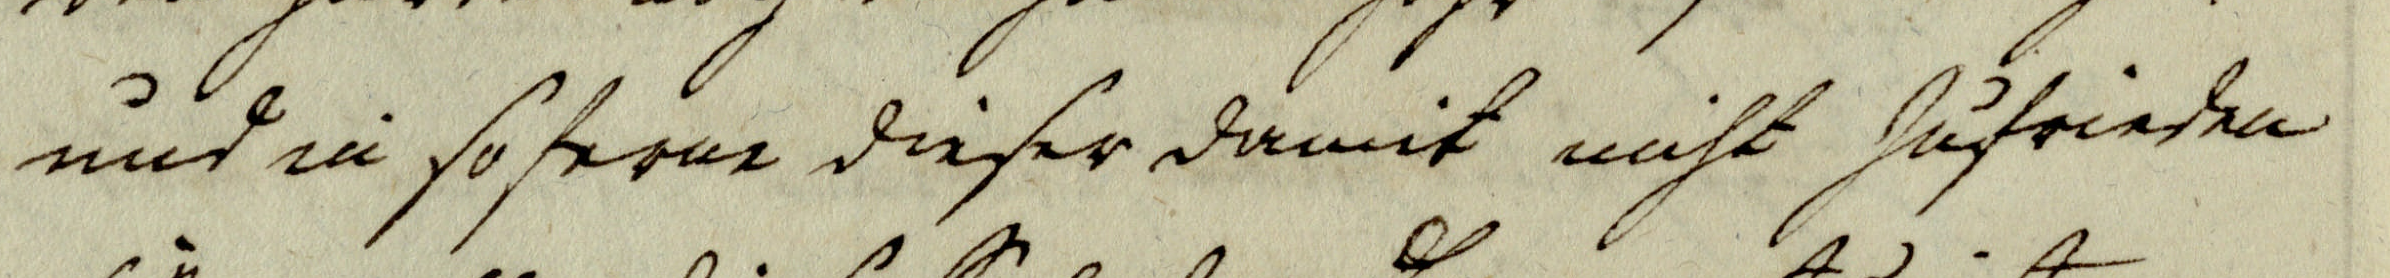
und in so ferne dieser damit nicht zufrieden
